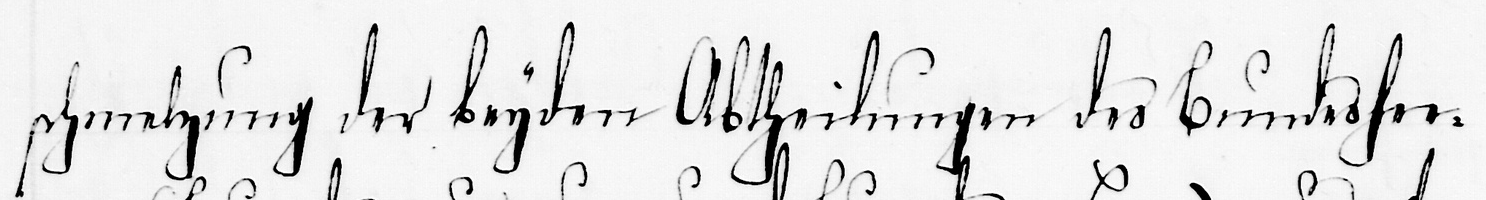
schmelzung der beyden Abtheilungen des Bundeshe¬
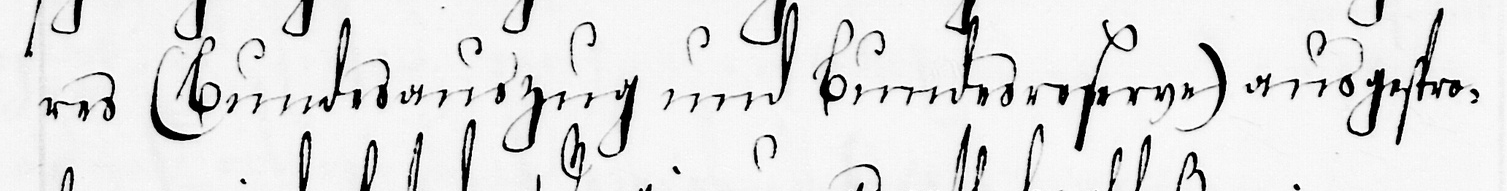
eres (Bundesauszug und Bundesreserve) ausgespro¬
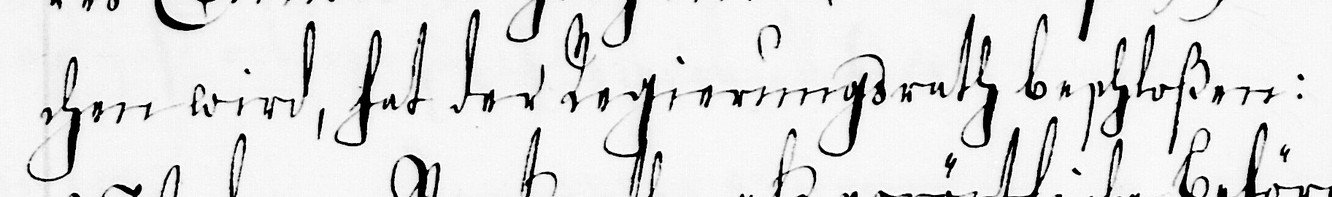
chen wird, hat der Regierungsrath beschloßen:
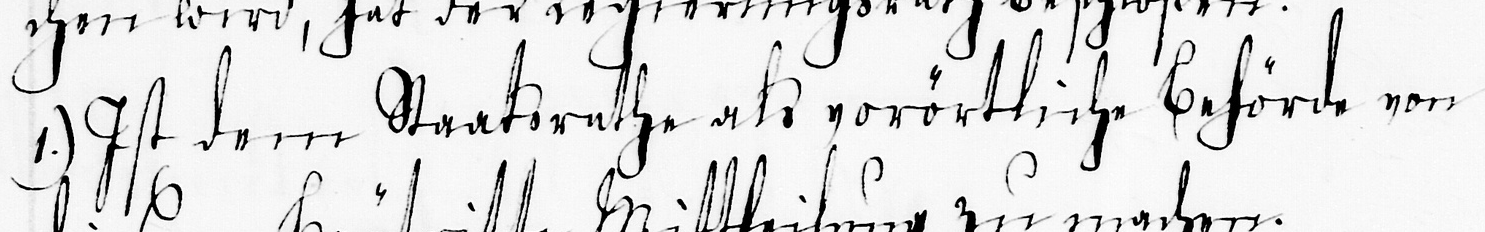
1.) Ist dem Staatsrathe als vorörtliche Behörde von
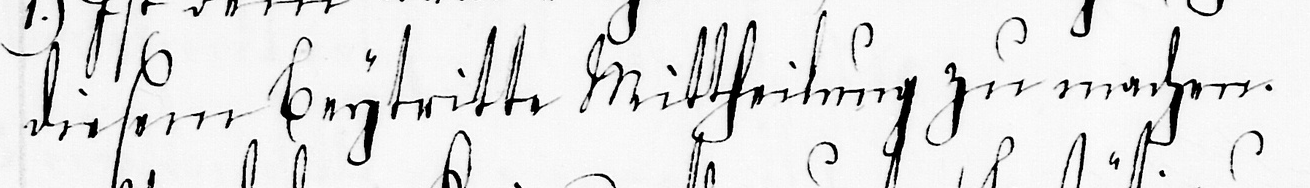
diesem Beytritte Mittheilung zu machen.
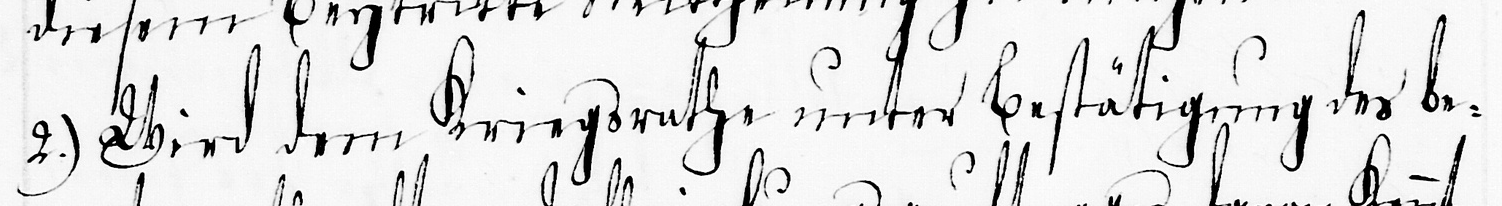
2.) Wird dem Kriegsrathe unter Bestätigung des be¬
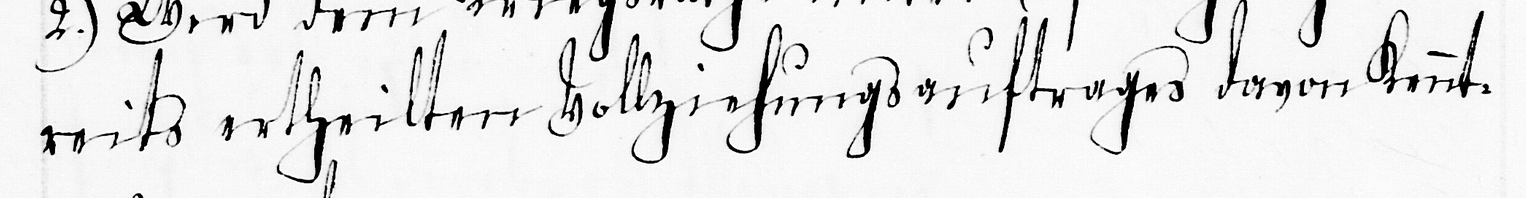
reits ertheilten Vollziehungsauftrages davon Kennt¬
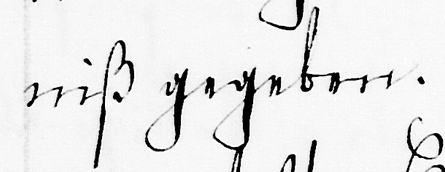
niß gegeben.
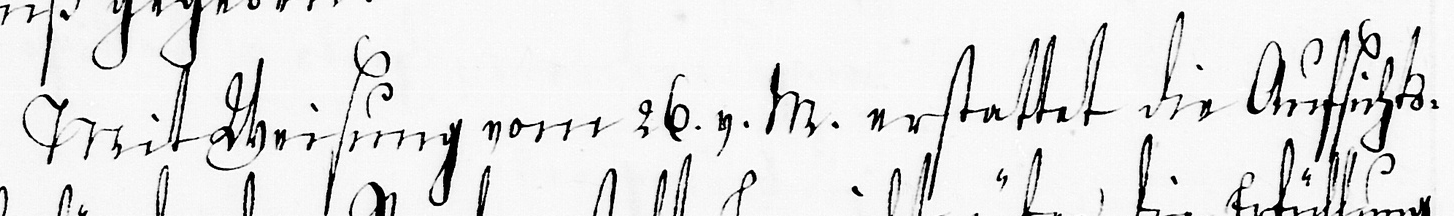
Mit Weisung vom 26. v. M. erstattet die Aufsicht¬
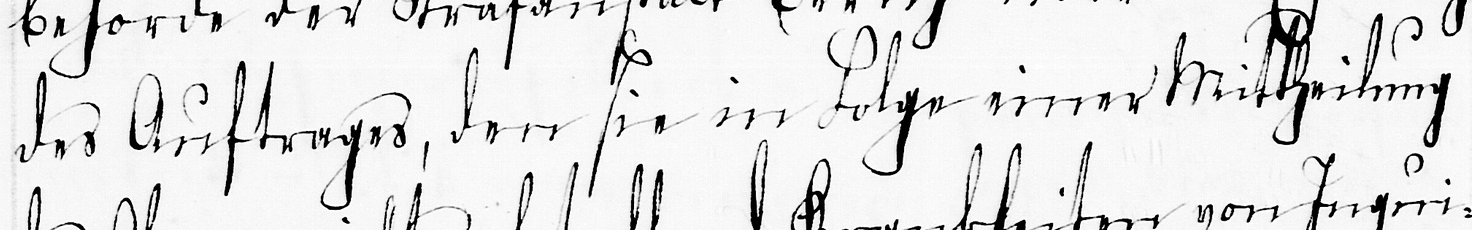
des Auftrages, den sie in Folge einer Mittheilung
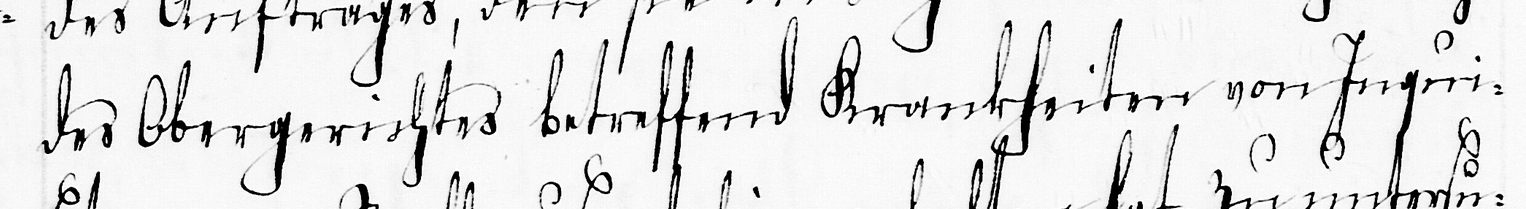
des Obergerichtes betreffend Krankheiten von Inqui¬
